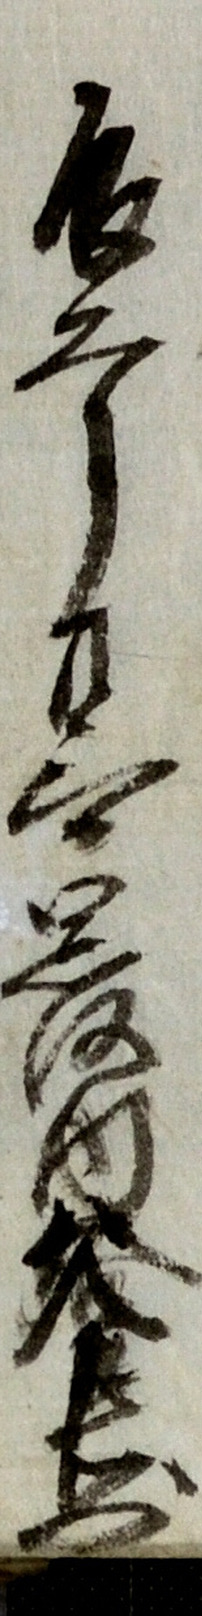辰二月廿三日黒河内谷右衛門
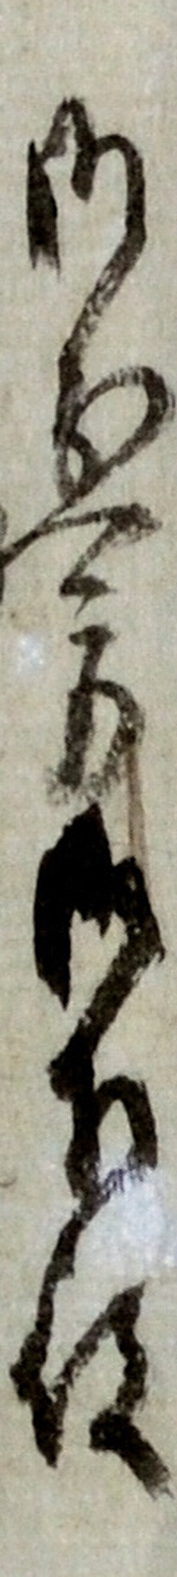御分一方御下役

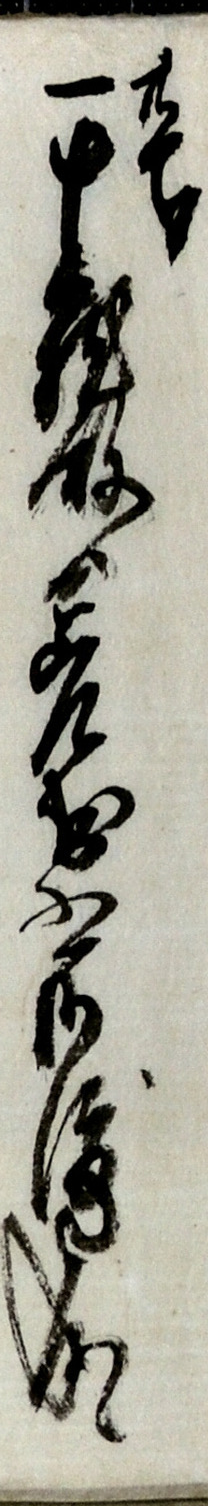一十蔵殿ゟ差出不御渡被成候
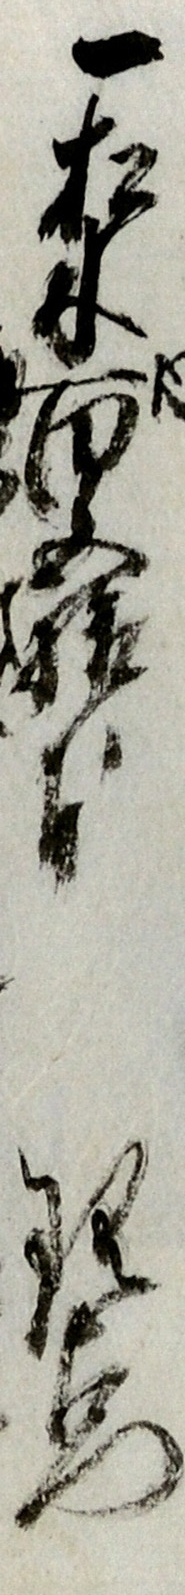一松木百五拾本理右衛門
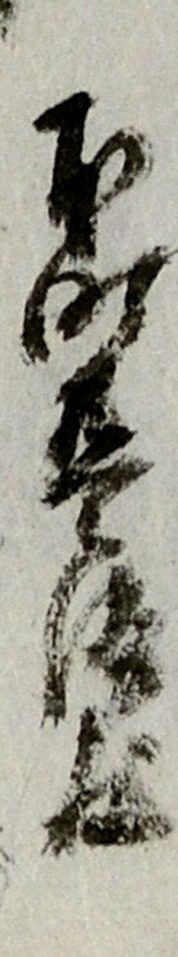本町河内屋
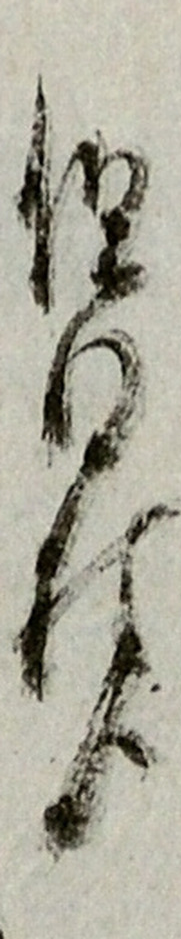但同村ゟ
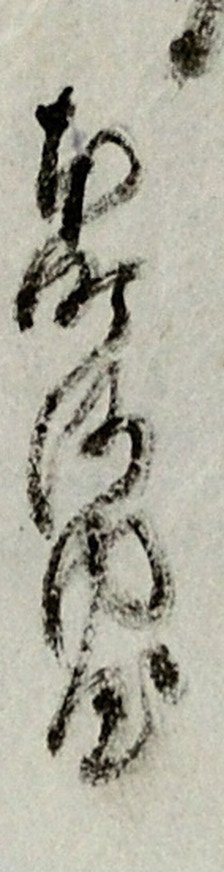本町河内屋
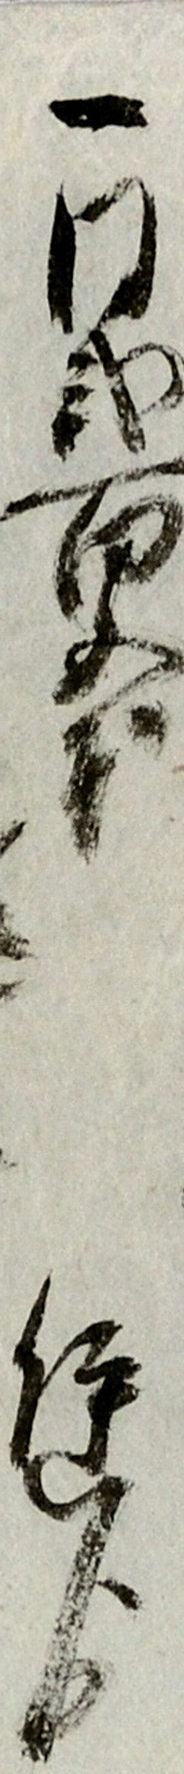一同弐百五本伊左衛門
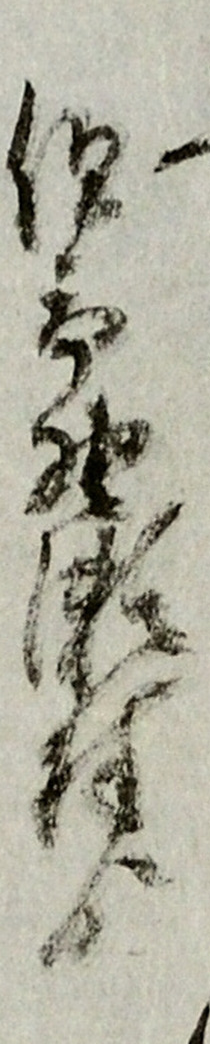但宮野瀬村ゟ
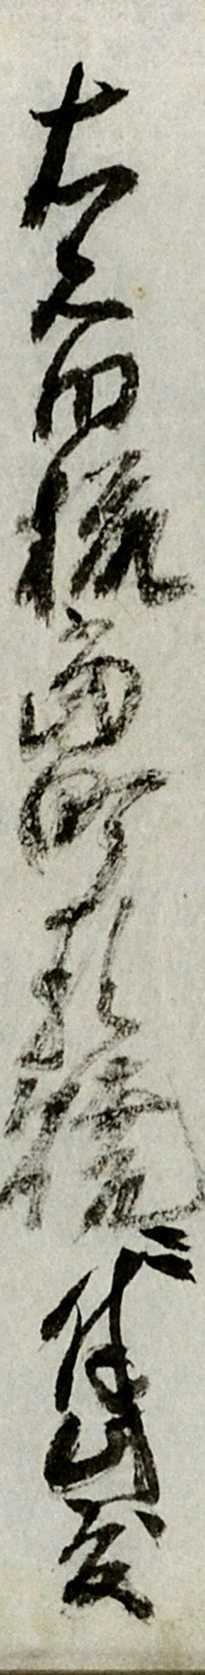右は旧臘当町類焼ニ付此度
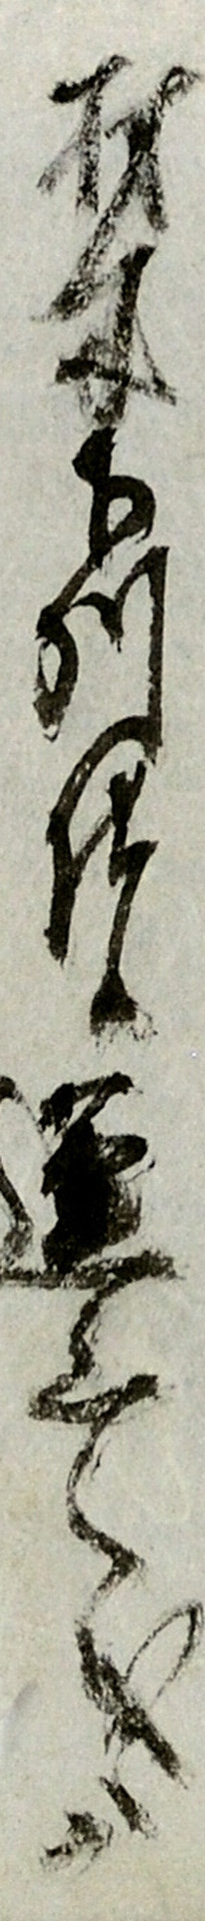材木下川仕候運上之義ハ
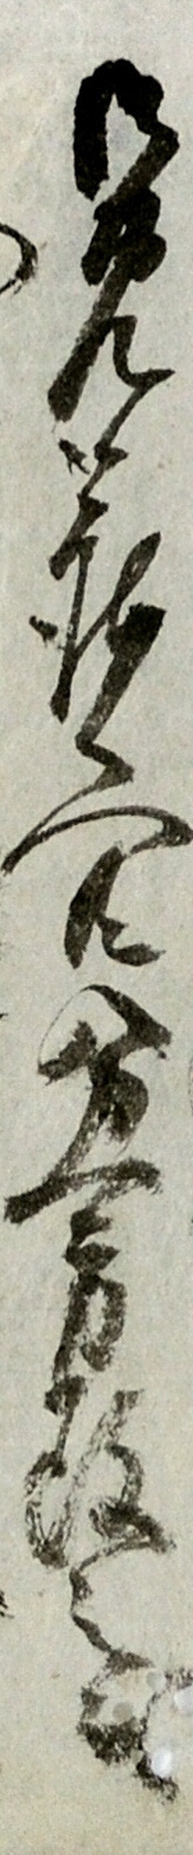御免御座候へ共分一方改之義
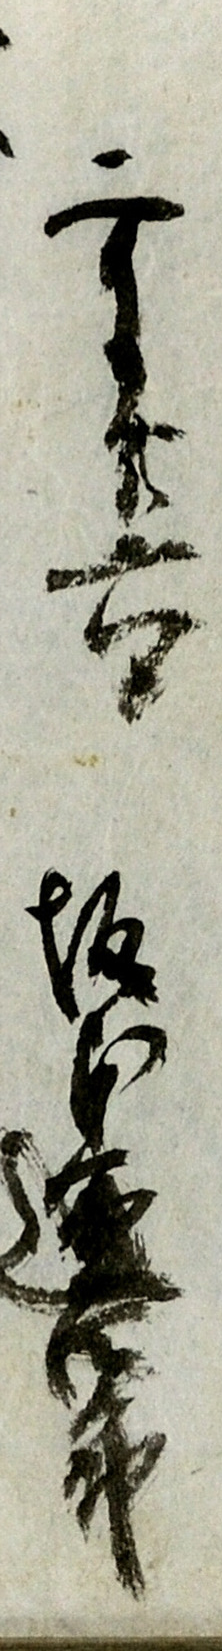二月廿六日坂本運四郎
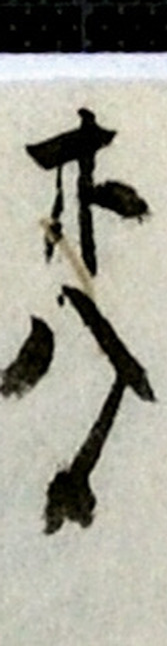廿八日
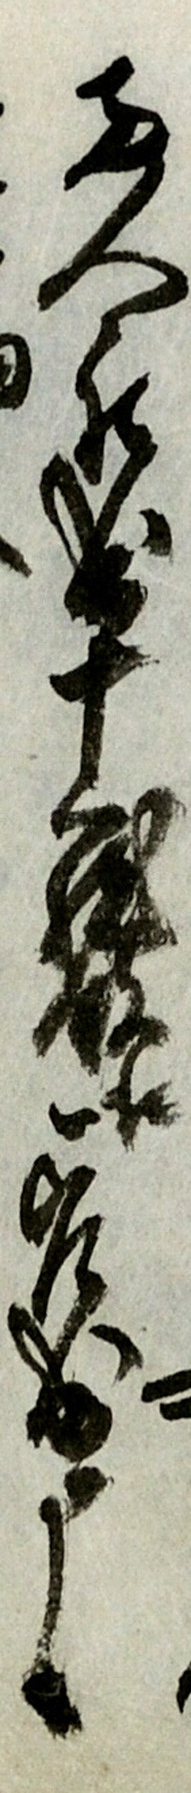両人罷出十蔵殿え差出申候
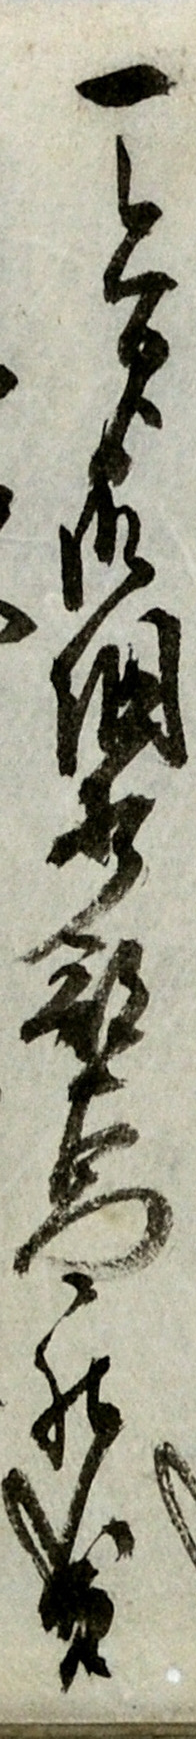一今日ゟ御網打郡右衛門罷成候
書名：分一方諸事御用留帳
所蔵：伊那市立高遠町図書館・合同会社AMANE
